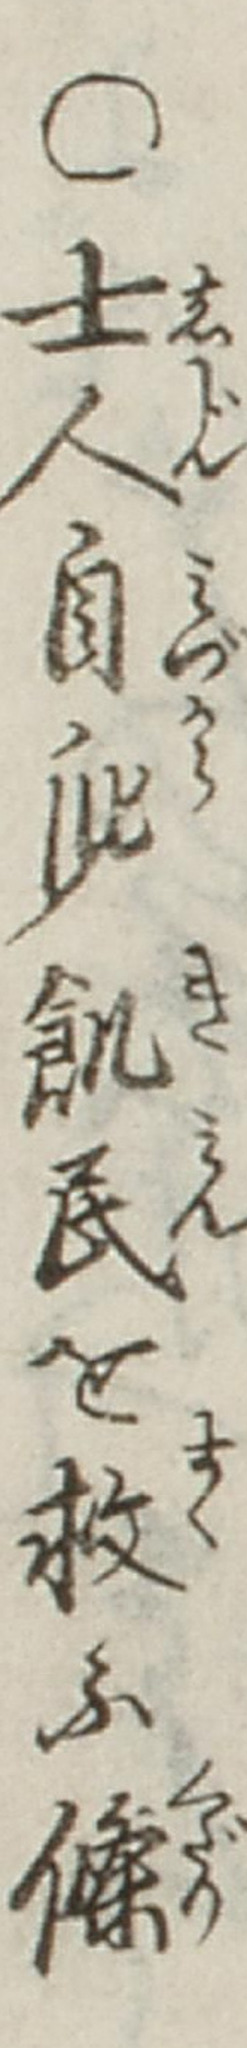〇士人自身飢民を救ふ条
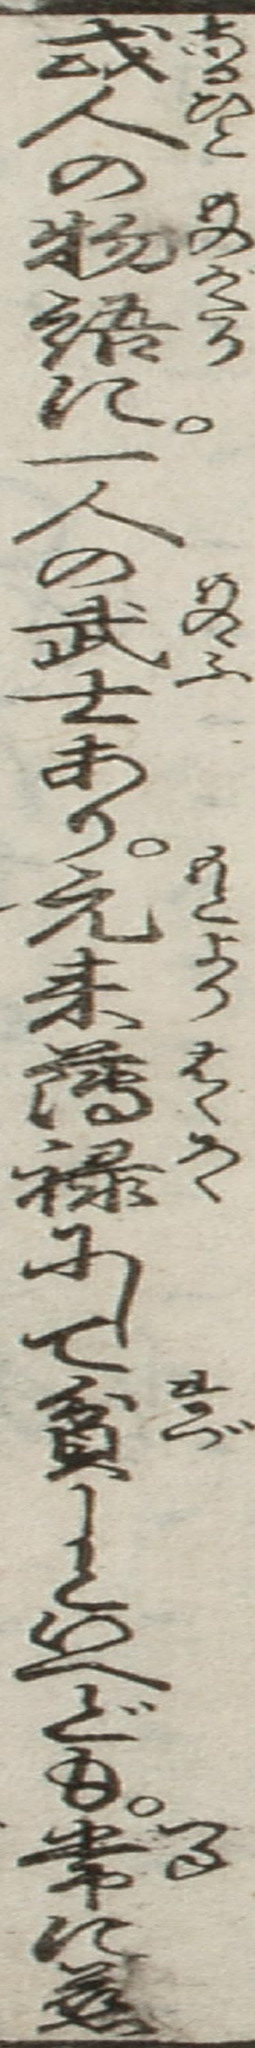或人の物語に。一人の武士あり。元来薄禄にして貧しといへども。常に慈
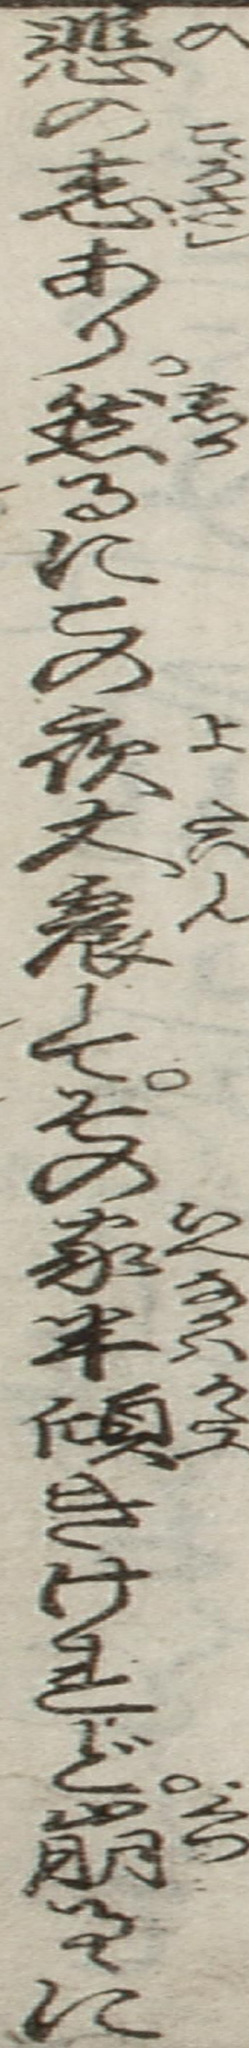悲の志あり。然るにこの夜大震して。その家半傾きけれど。崩るゝに
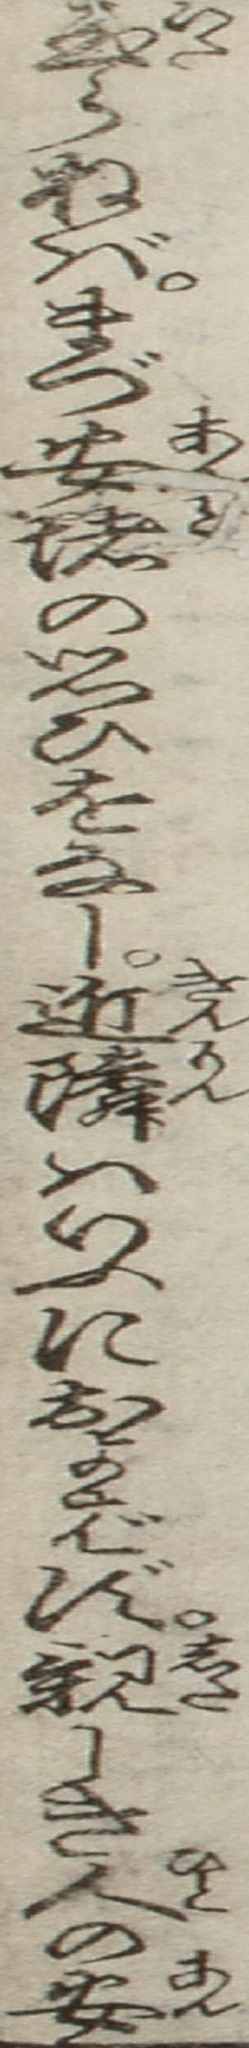至らねば。まづ安堵の思ひをなし。近隣はいふにおよばず。親しき人の安

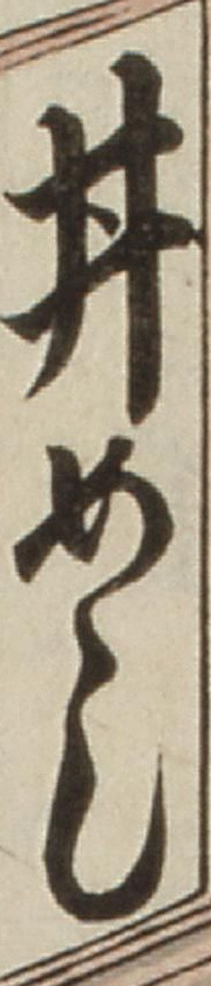丼めし
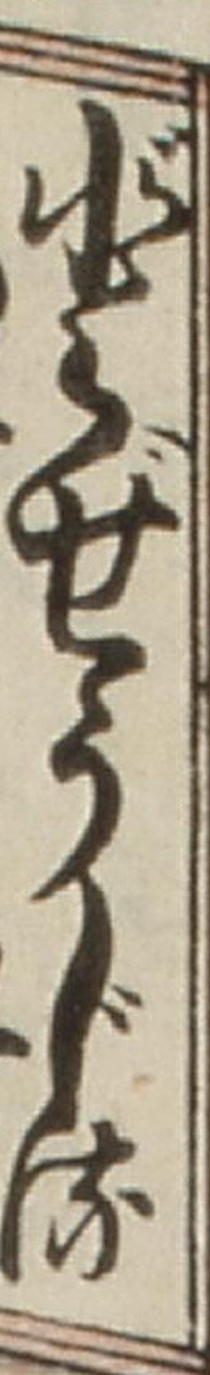どぜうじる
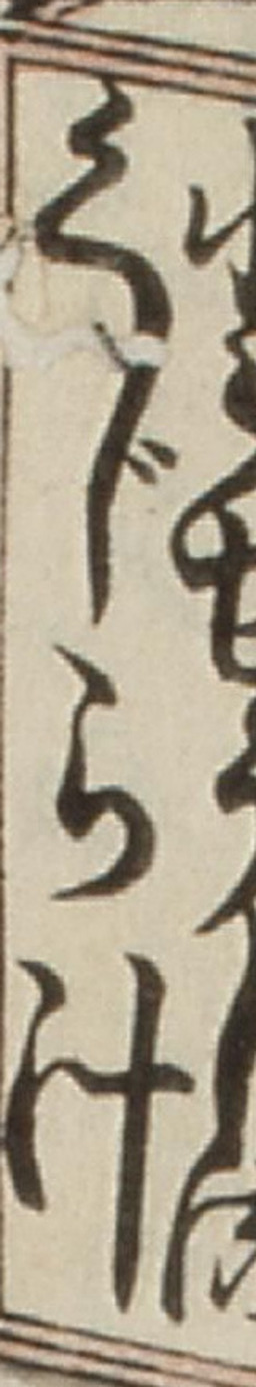くじら汁
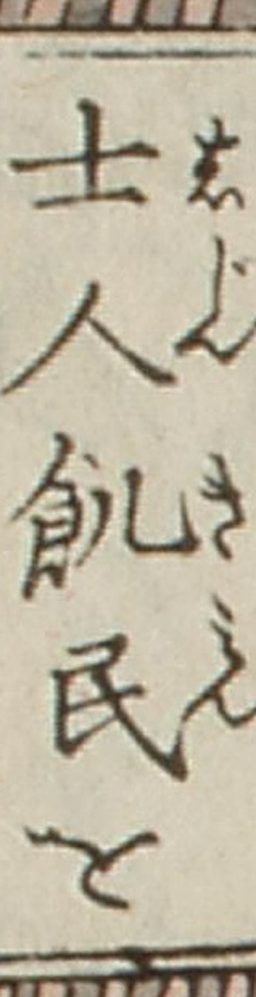士人飢民を
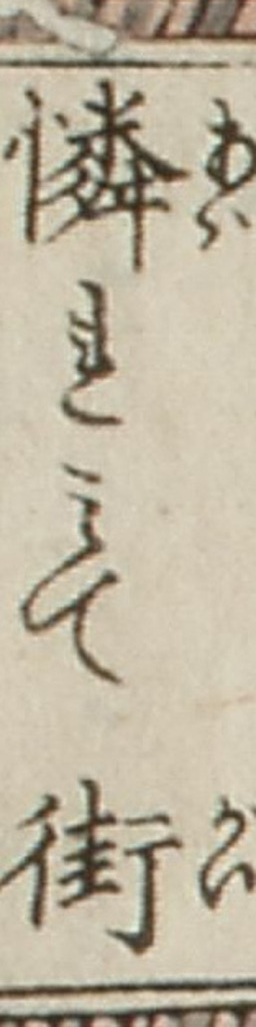憐れみて街
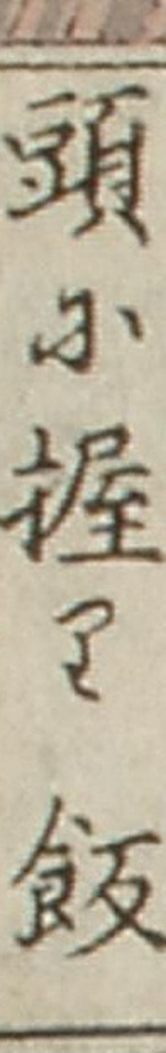頭に握り飯
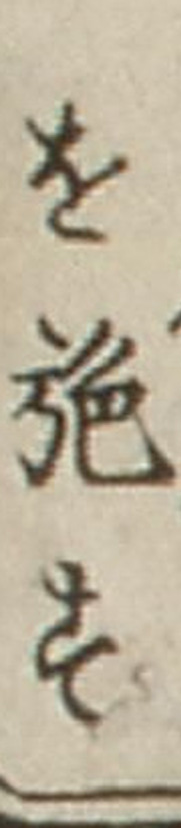を施す

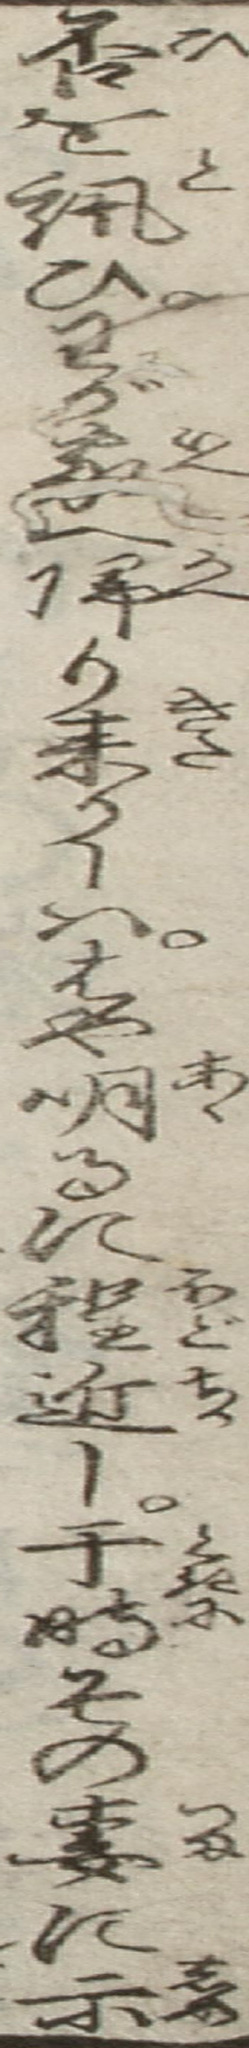否を訊ひ。わが家へ帰り来りしは。はや明るに程近し。于時その妻に示
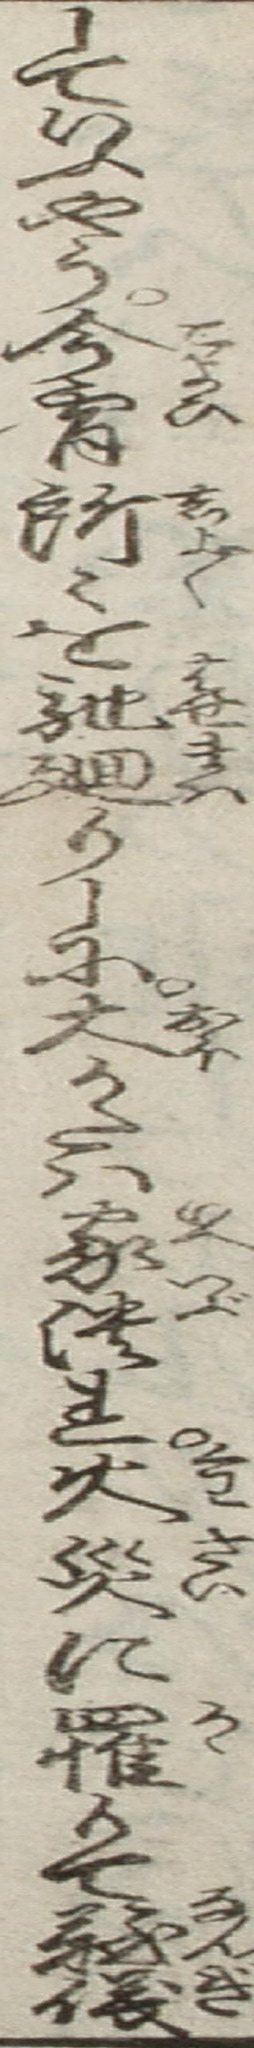していふやう。今宵所〻を馳廻りしに。大かたは家潰れ。火災に罹りて難儀
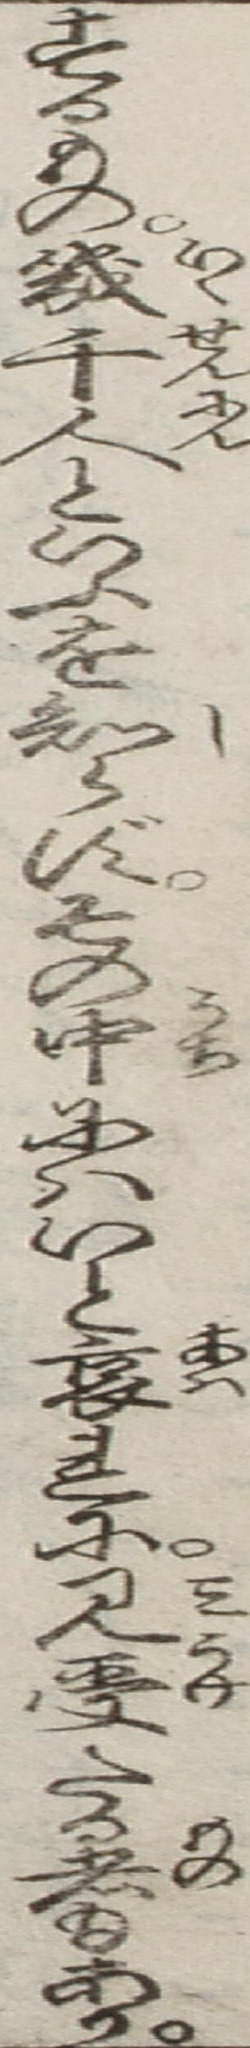するもの。幾千人といふを知らず。その中にはいと哀れに。見受たる者もあり。
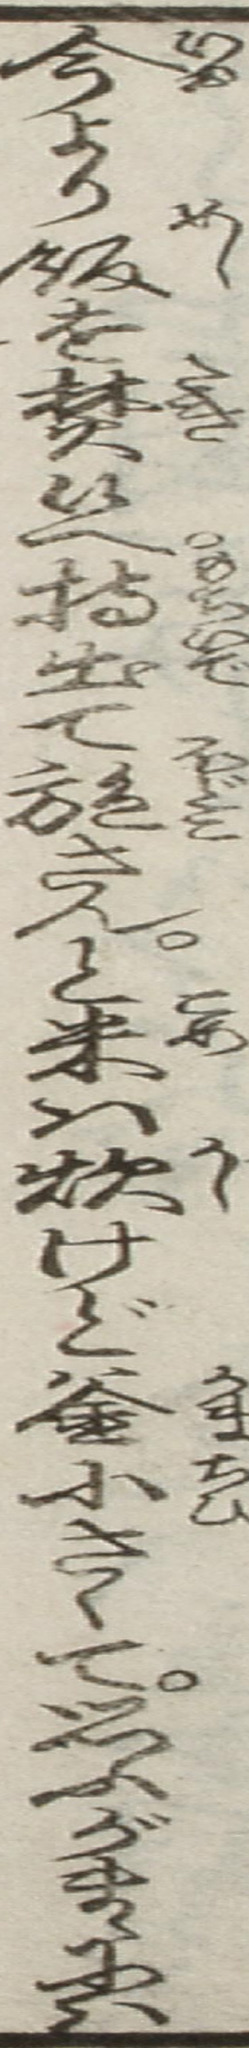今より飯を焚候へ。持出て施さん。と米は炊けど釜小さくて。思ふがまゝには
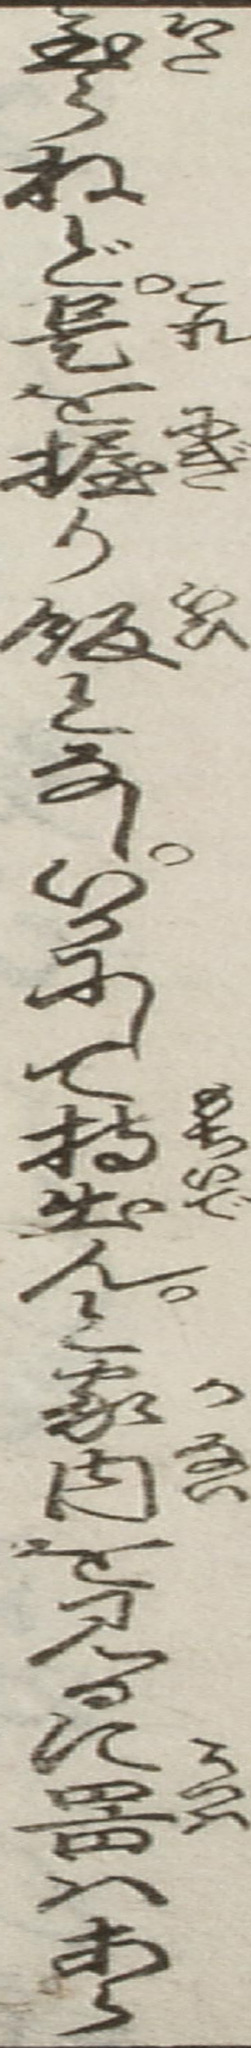至らねど。是を握り飯となし。いかにして持出ん。と家内を見るに器はあら
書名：安政見聞録　上
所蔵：東京大学地震研究所図書室 Earthquake Research Institute Library, The University of Tokyo, JAPAN
